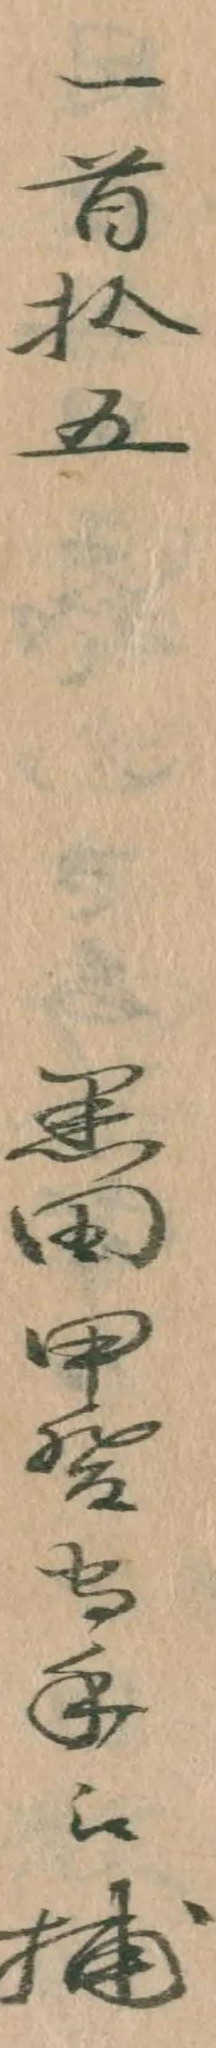一首拾五黒田甲斐守手江捕
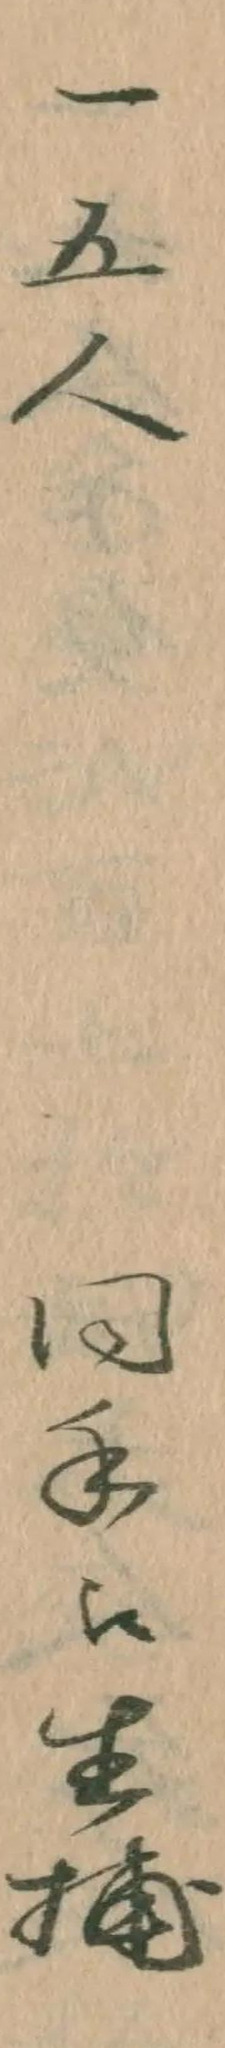一五人同手江生捕
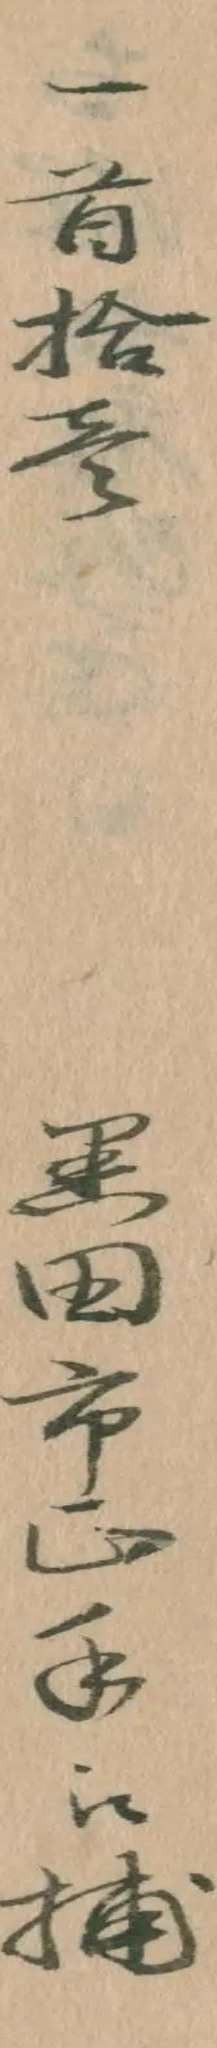一首拾壱黒田市正手江捕
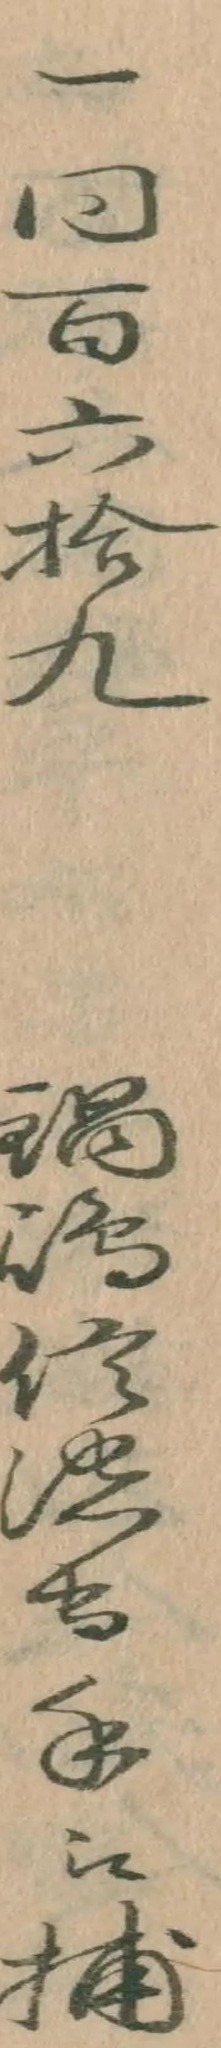一同百六拾九鍋島信濃守手江捕
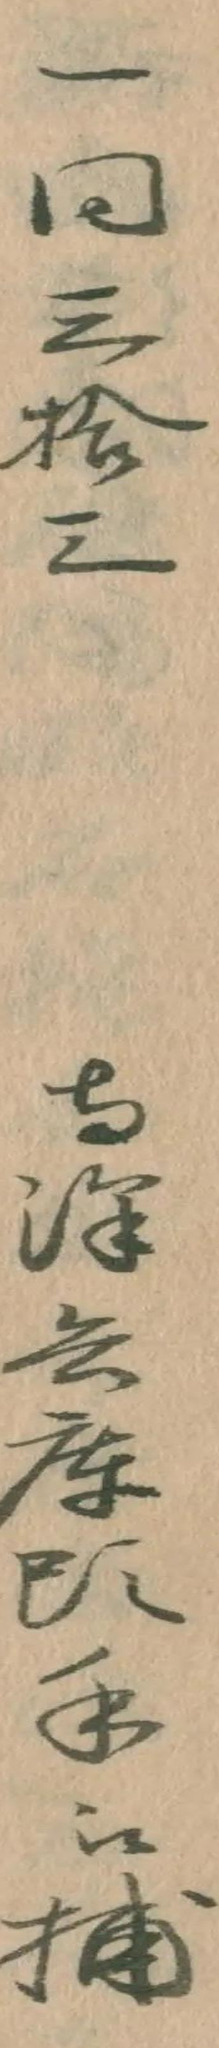一同三拾三寺沢兵庫頭手江捕
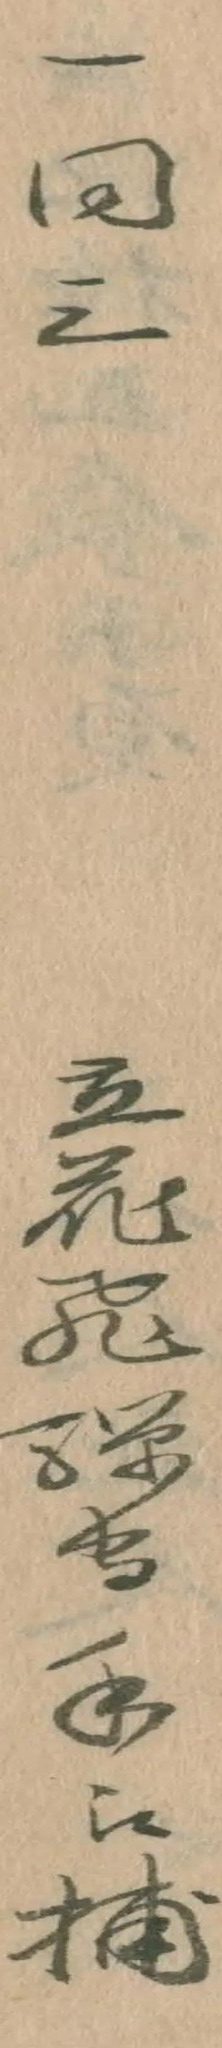一同三立花飛騨守手江捕
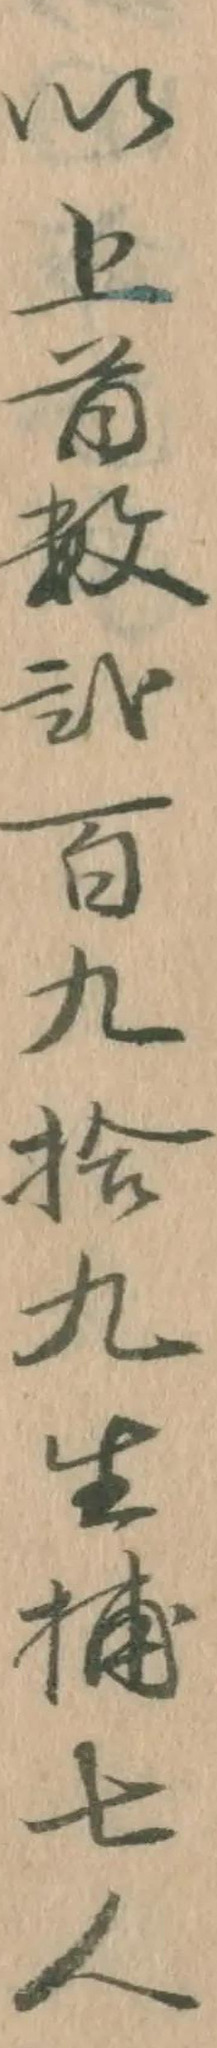以上首数弐百九拾九生捕七人
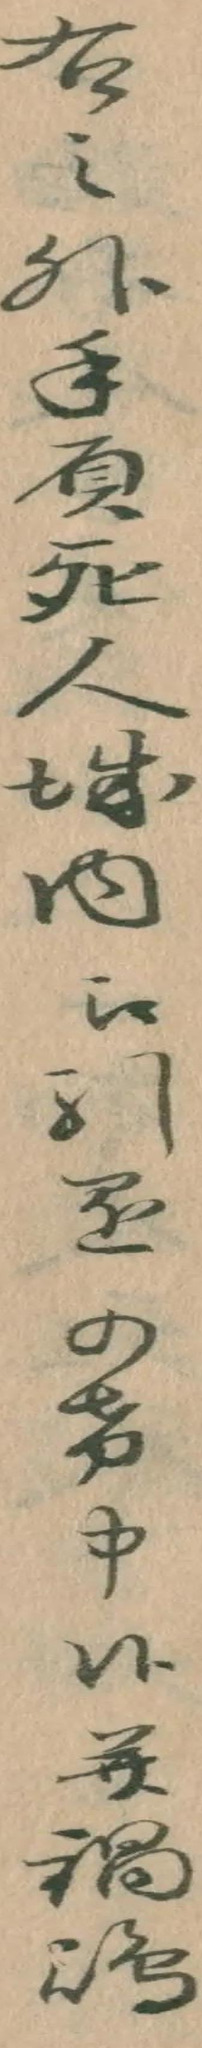右之外手負死人城内江引懸の希申候幷鍋島
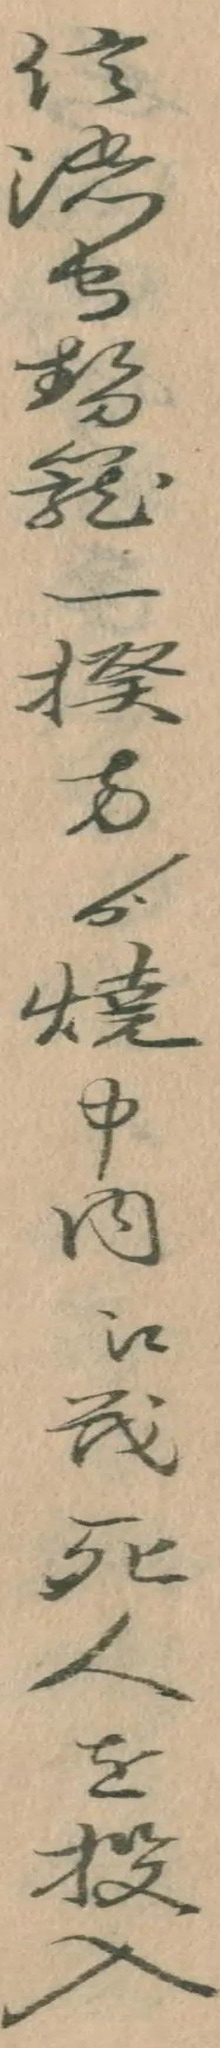信濃守勢籠一揆方ゟ焼申内江茂死人を投入
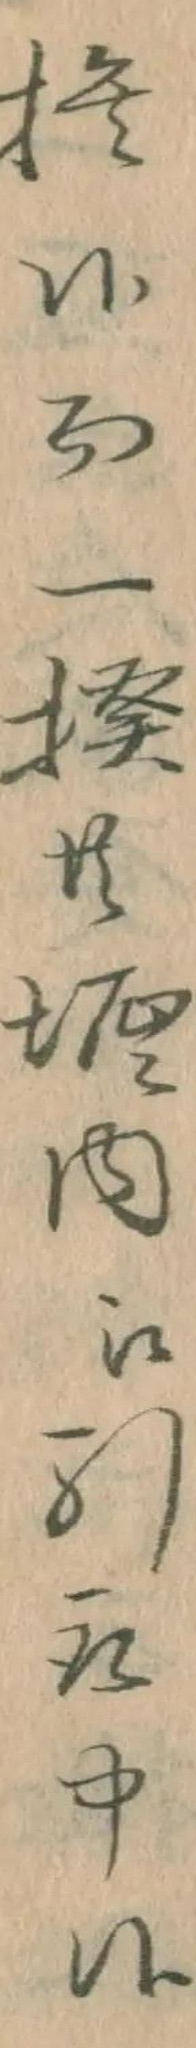捨候而一揆共堀内江引取申候
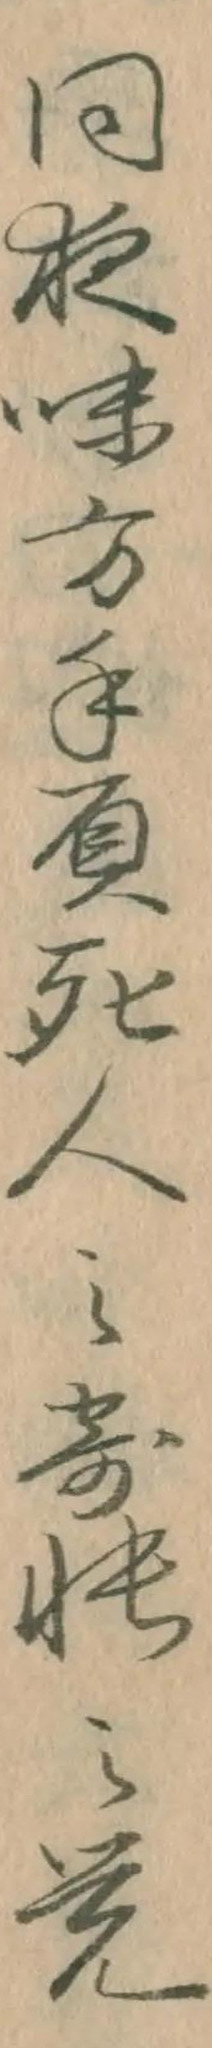同夜味方手負死人之寄帳之覚

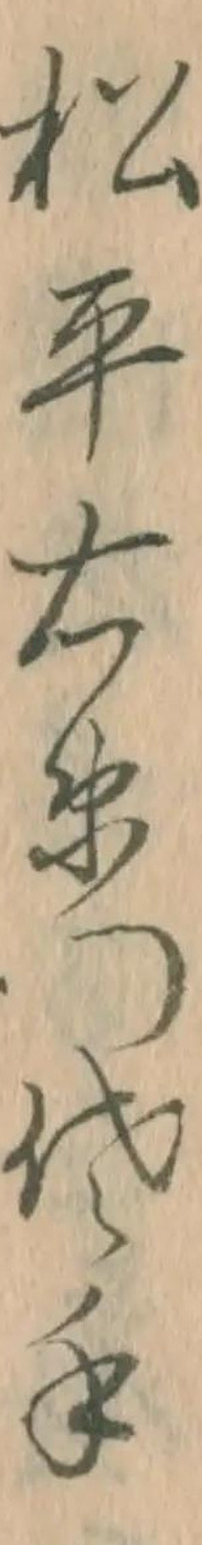松平右衛門佐手
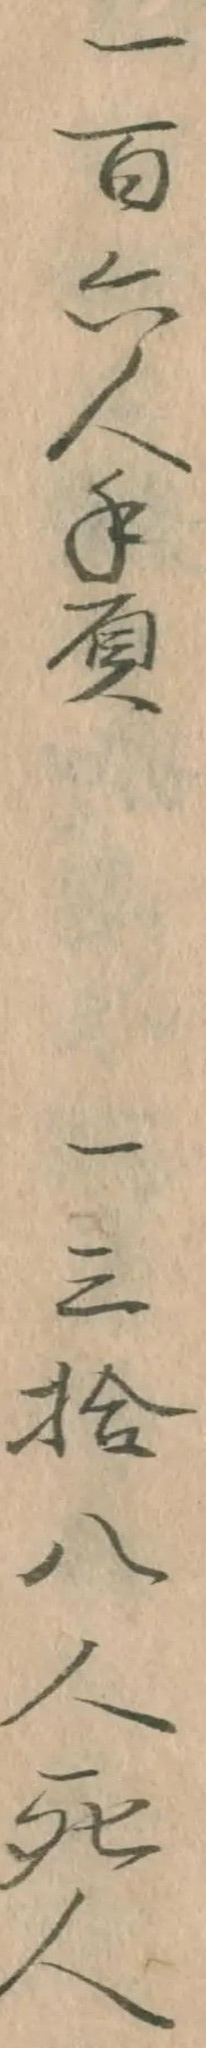一百六人手負一三拾八人死人
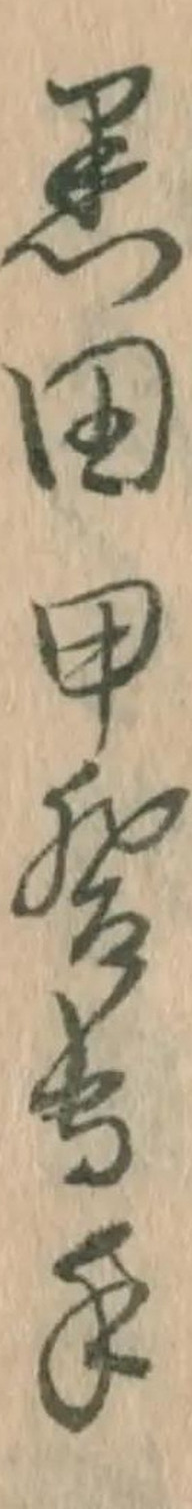黒田甲斐守手
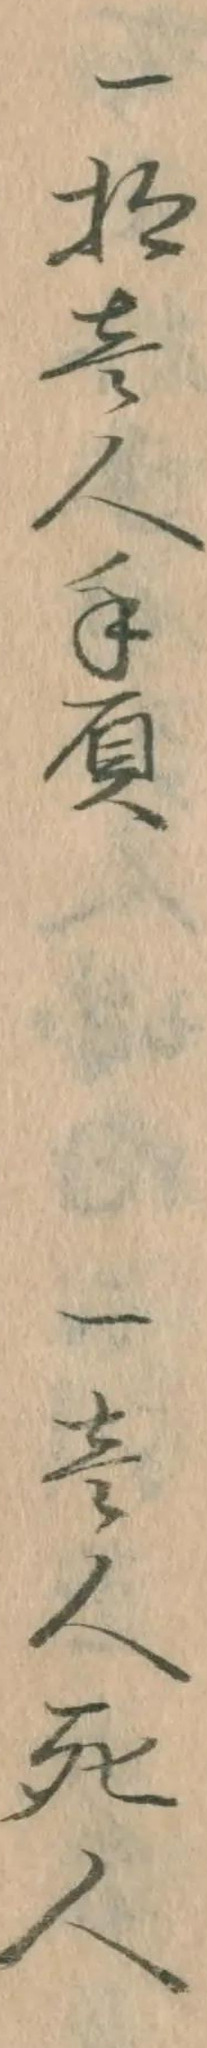一拾壱人手負一壱人死人
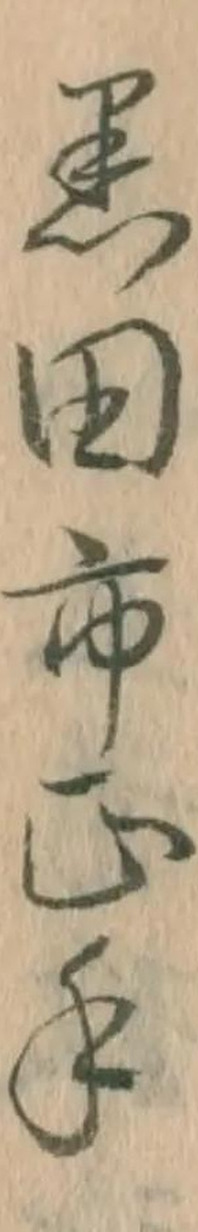黒田市正手
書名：切支丹御退治記 49巻. [7]
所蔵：国立国会図書館 National Diet Library, JAPAN
